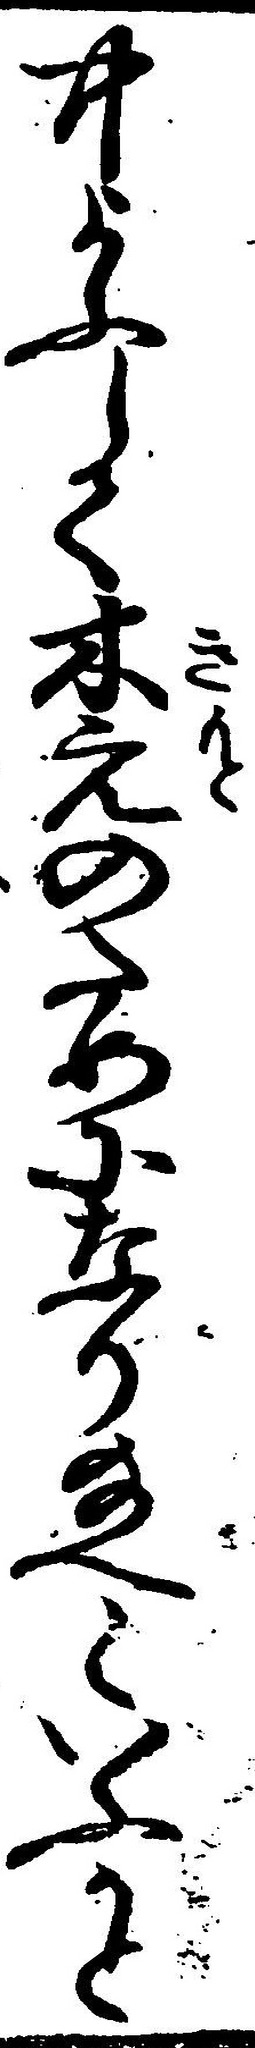中よふして木元のためになり給へといふかと
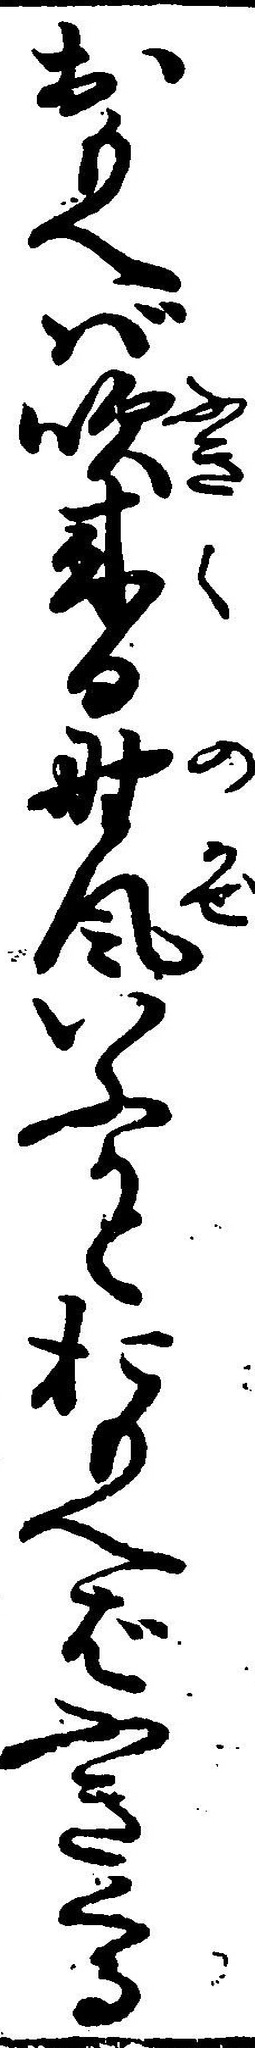おもへば吹来る野風いふかとおもへばふきくる
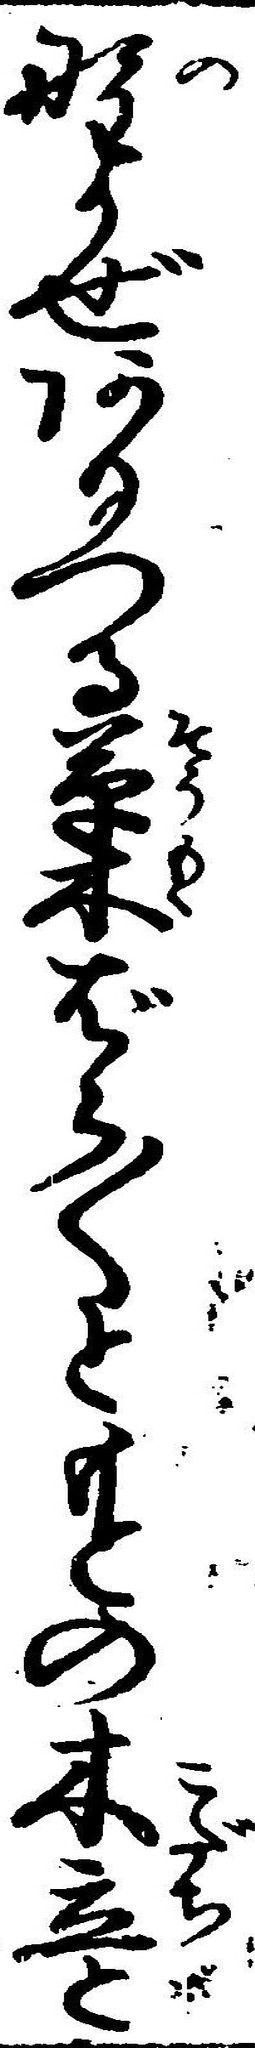野かぜありつる草木ばら〳〵ともとの木立と
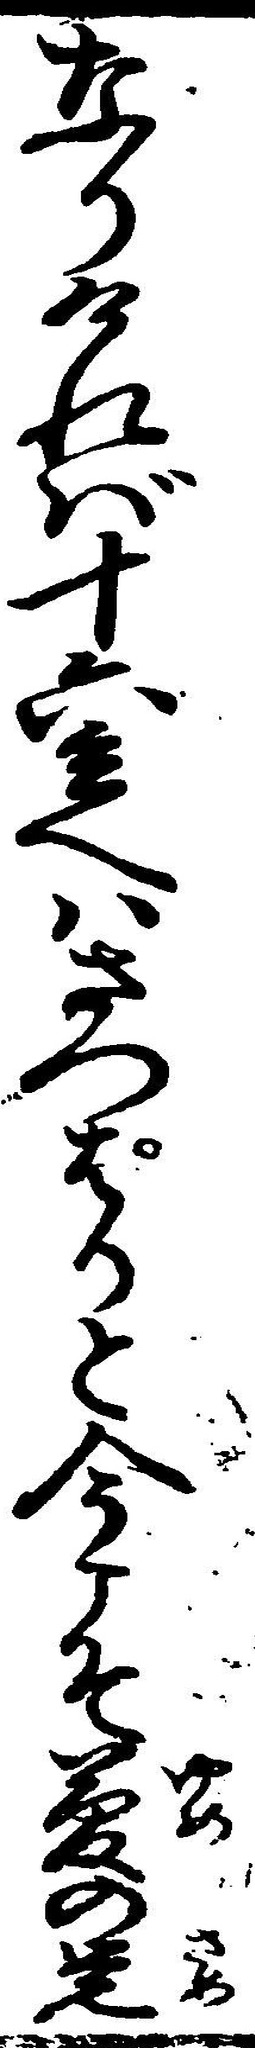なりければ十六兵衛はさつぱりと今こそ夢の覚
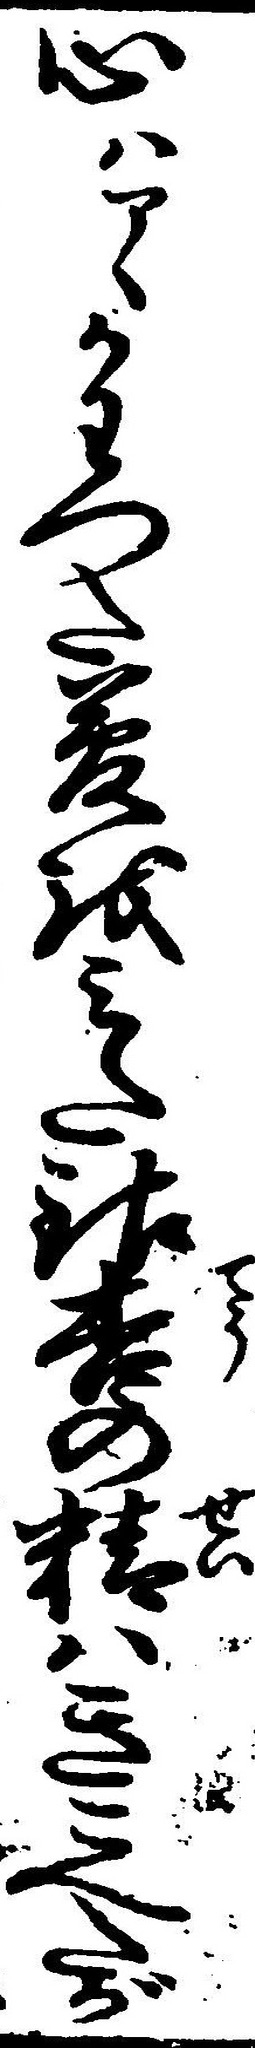心ハアヽかわつた夢をみた銀杏の精はきこへたが
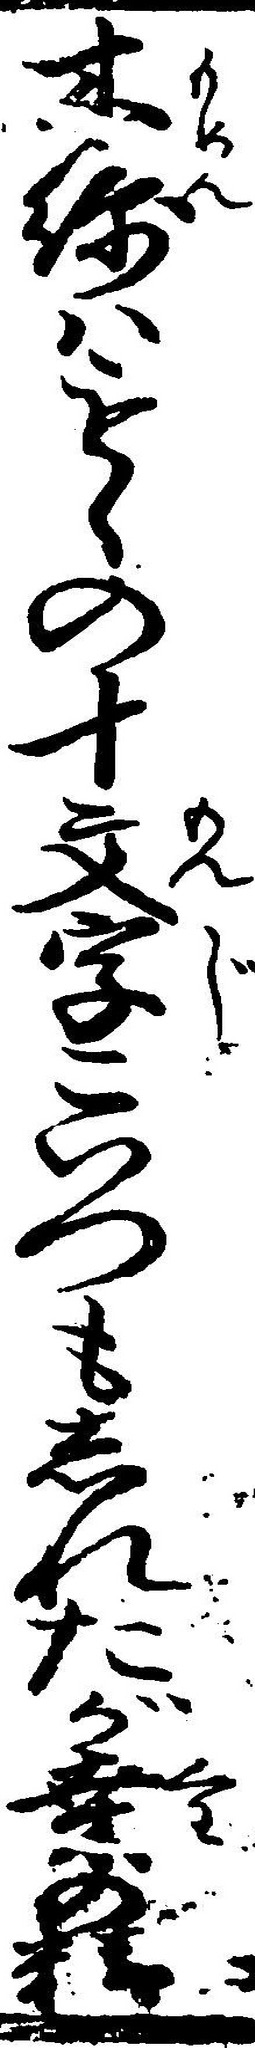木綿はもとの十文字こいつもしれたが桑の精
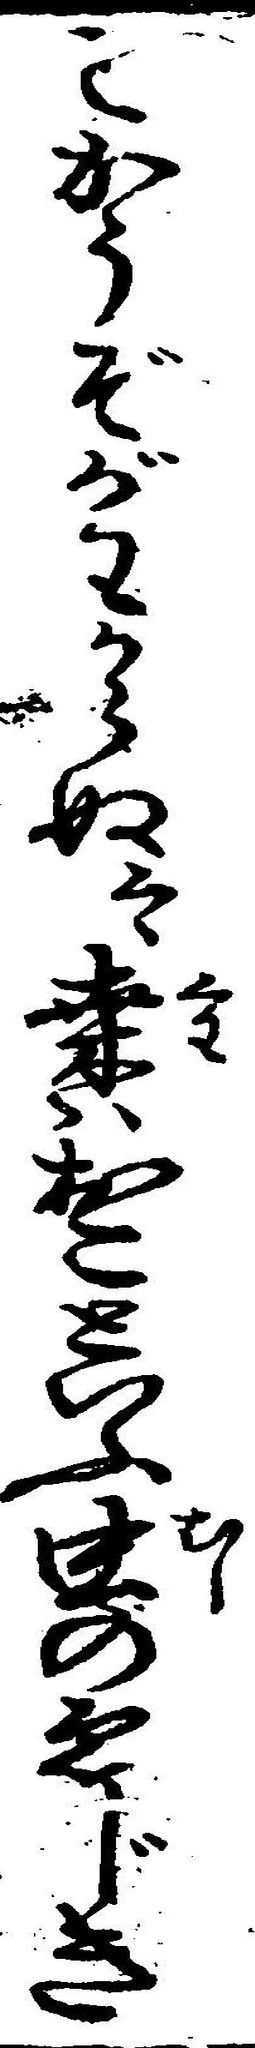とかうぞがわからぬムヽ桑はおこといふ虫のゑじき
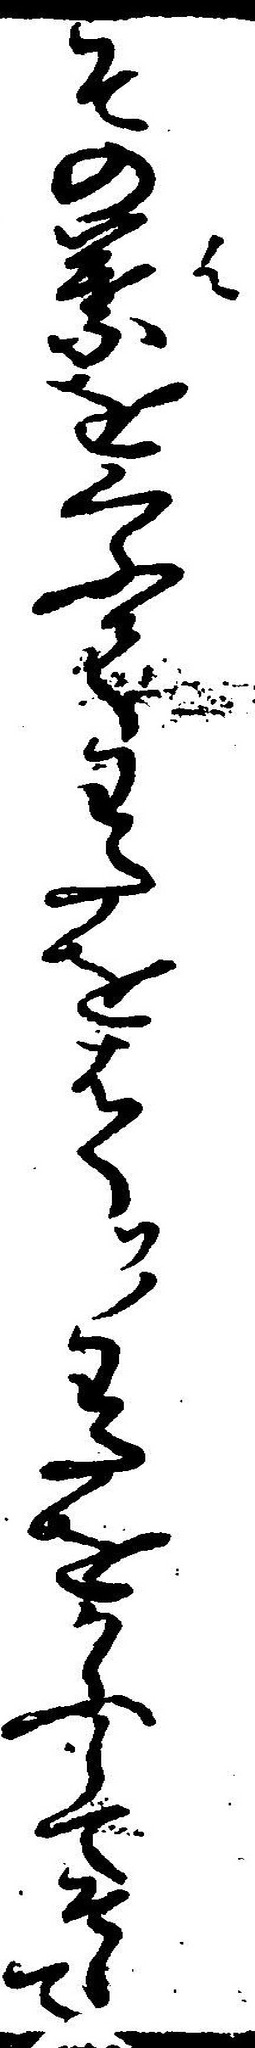その葉をくふてわたをはくソノわたをかふしてそして
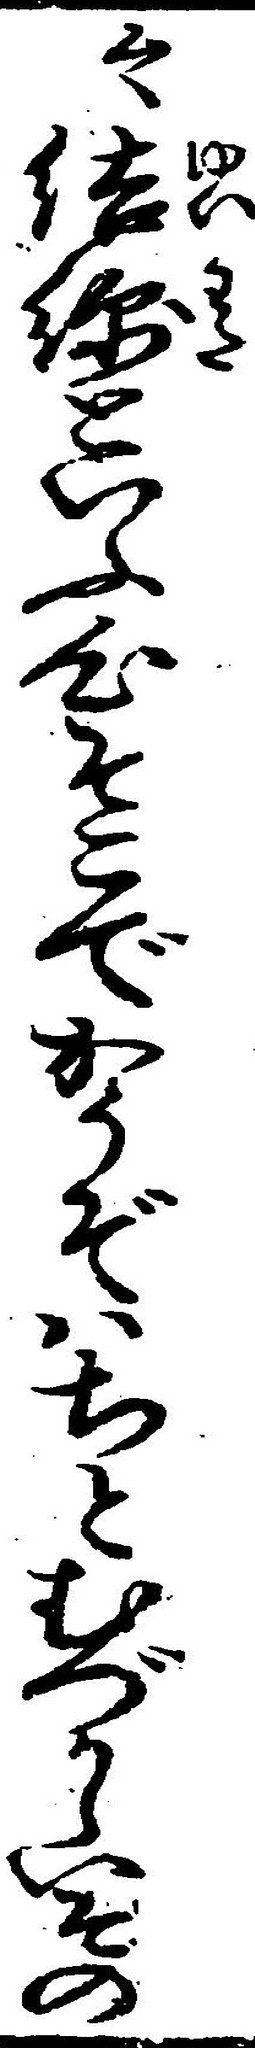ムヽ結綿といふ心そこでかうぞはちとむづかしいその
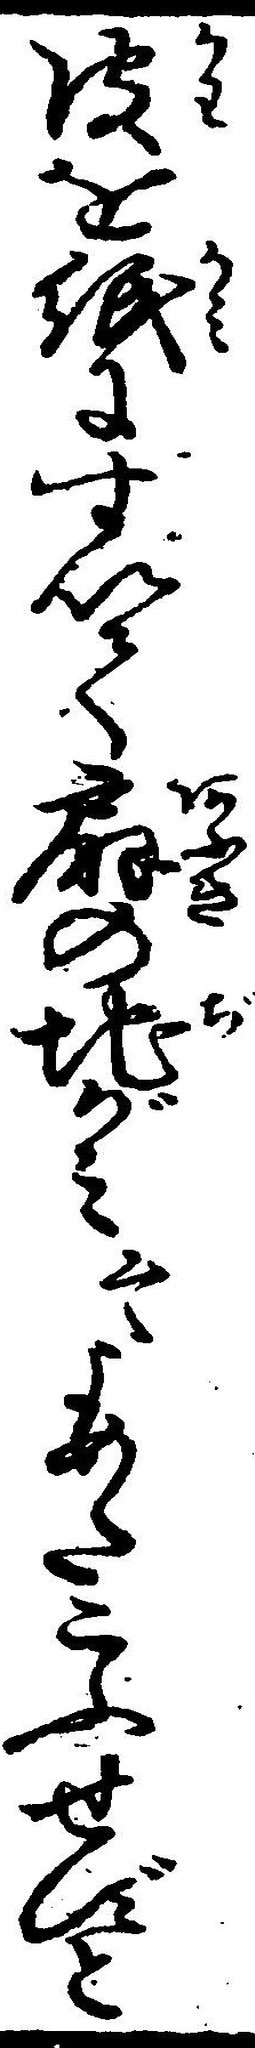皮を紙にすいて扇の地がみムヽよめたこふせずと
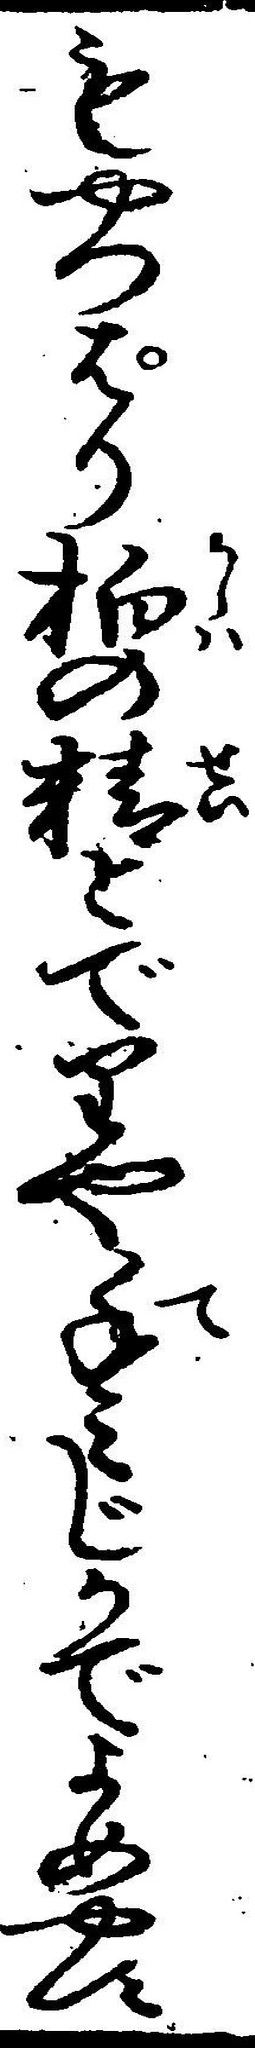もやつぱり柏の精とでりや手みじかでよめやす
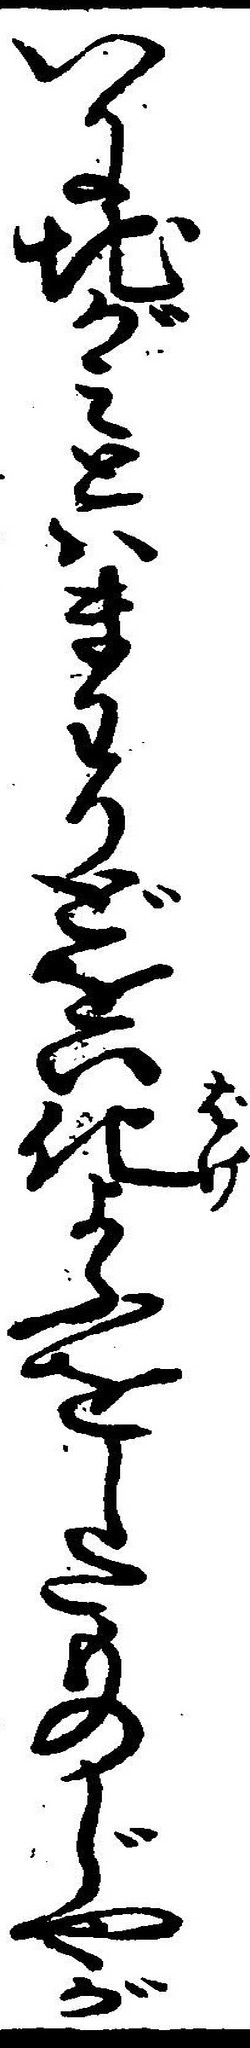いに地がみとはまわりどをい化よふをしたものじやが
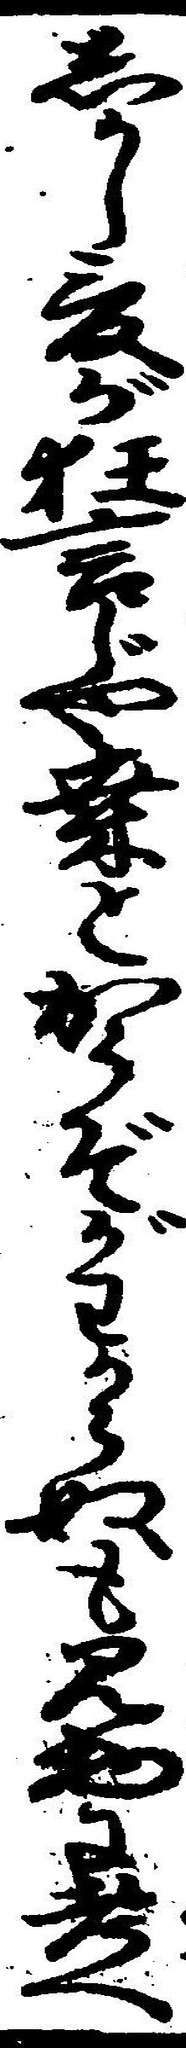しかし爰が狂言じや桑とかうぞがわからぬも見物に考へ

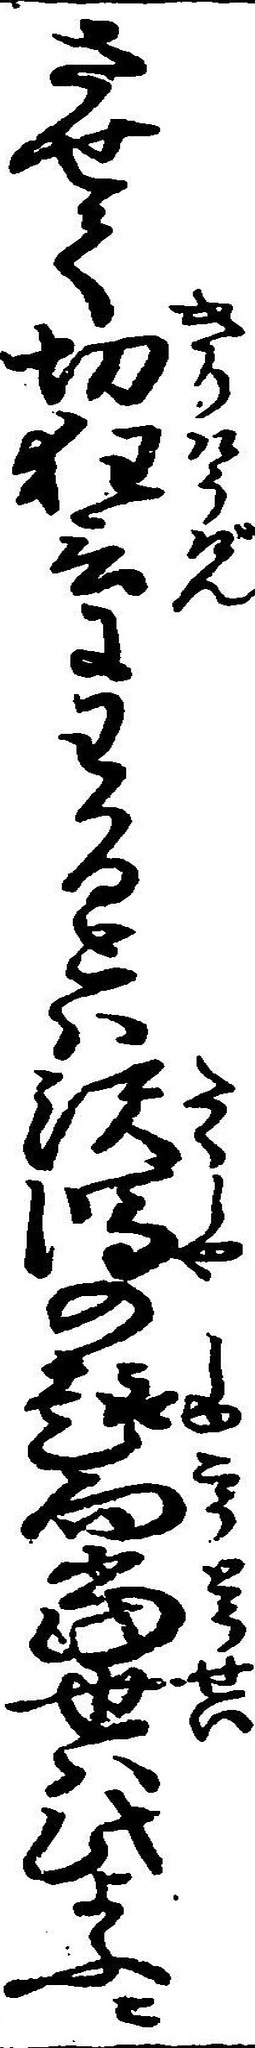させて切狂言にわかるとは沢瀉の趣向当世は此よふ
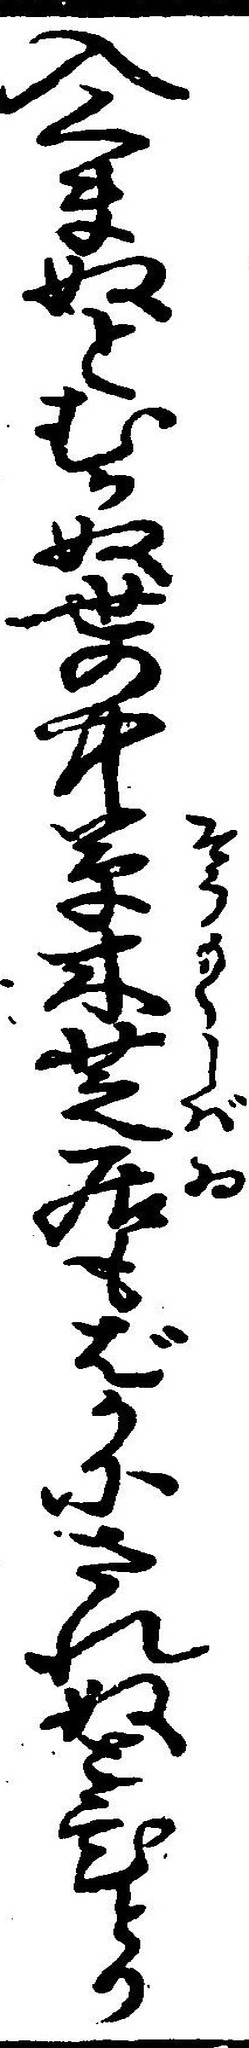入くまぬとむかぬ世の中草木芝居もばかにされぬとひとり
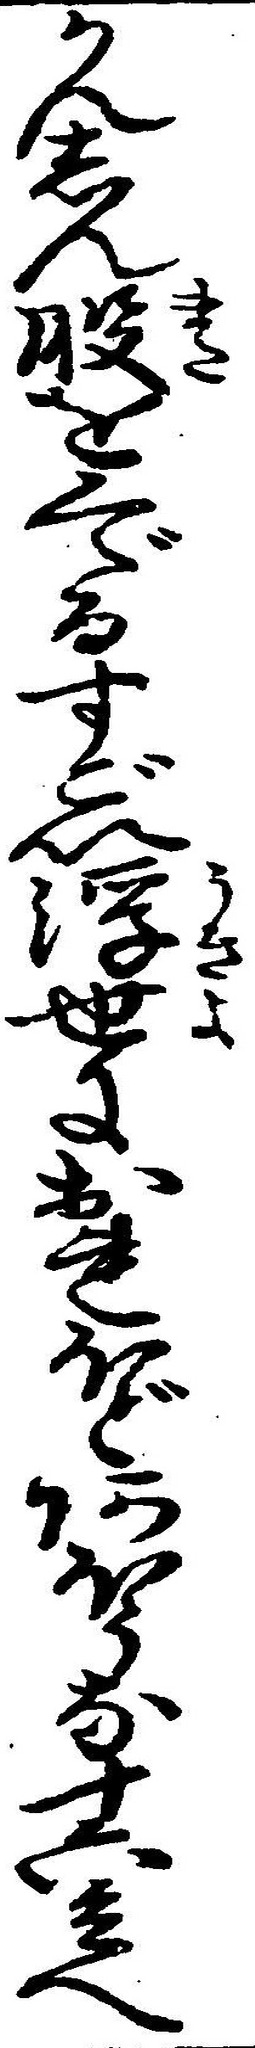かんしん股くゞるすごい浮世におれほどあほうな十六兵衛
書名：草木芝居化物退治 / 泉花堂三蝶(十六兵衛)作
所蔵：東京大学総合図書館 General Library in the University of Tokyo, JAPAN
